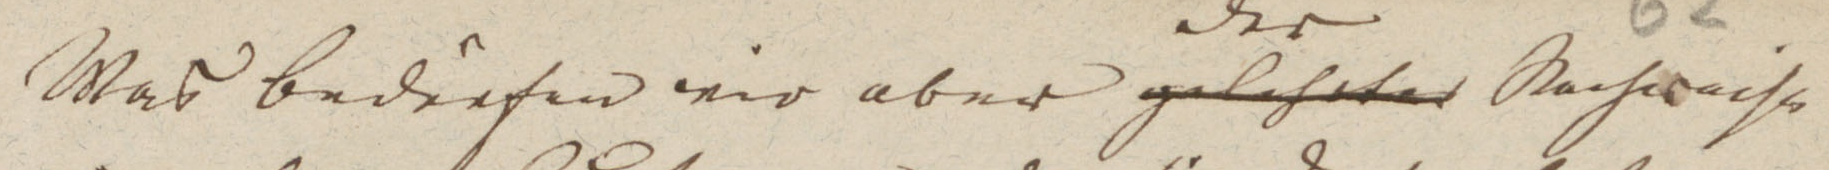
Was bedürfen wir aber gelehrter der Nachweise
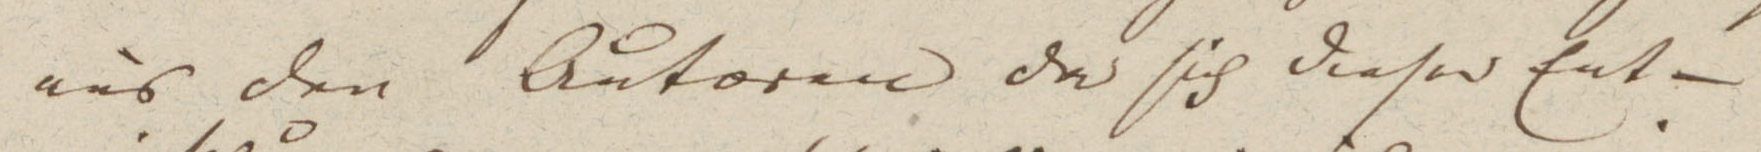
aus den Autoren da sich dieser Ent-
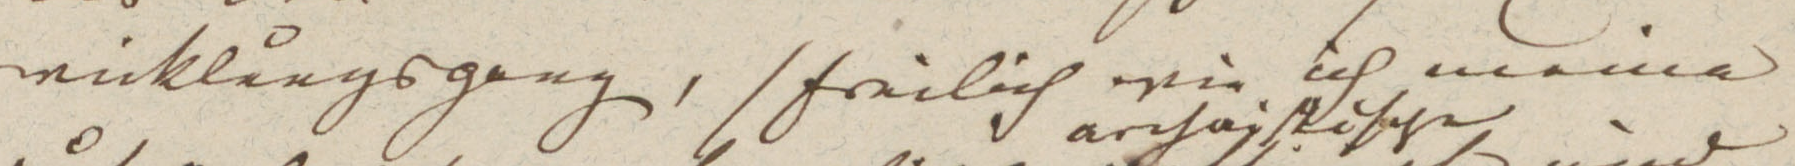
wicklungsgang, (freilich wie ich meine
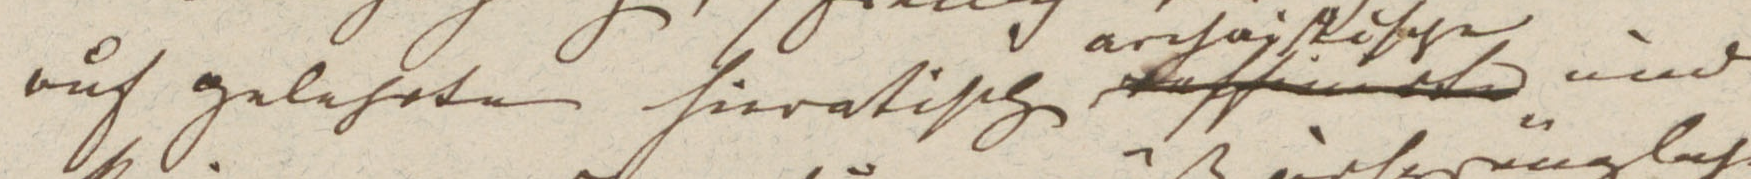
auf gelehrte hieratisch raffinirte archaistische und
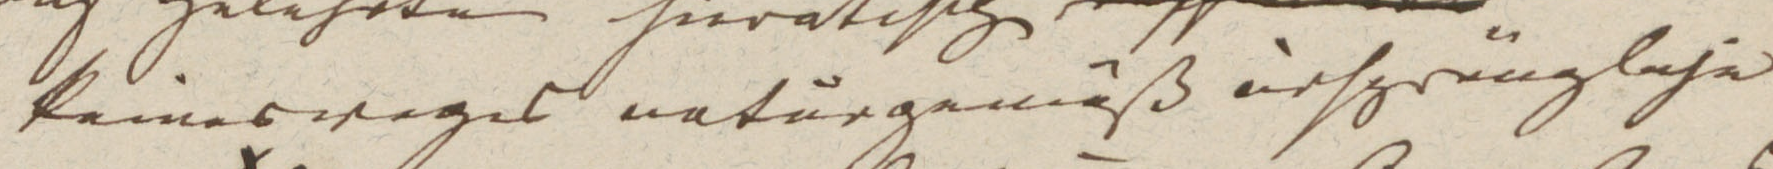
keinesweges naturgemäss ursprüngliche
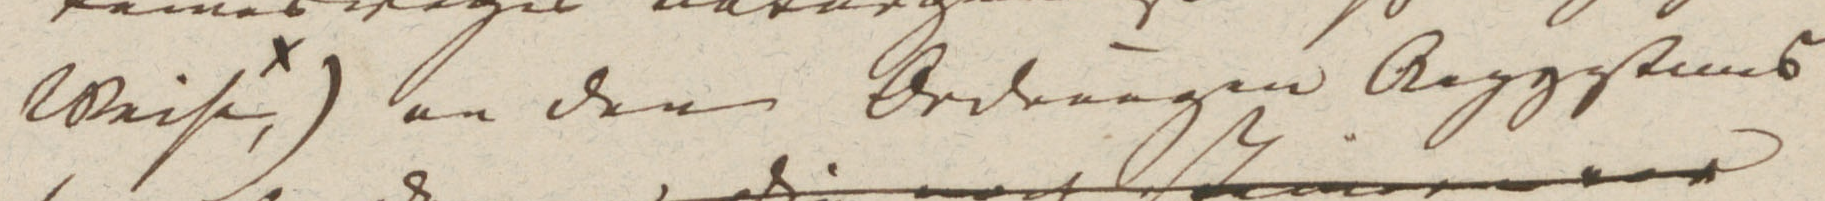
Weise,%) an den Ordnungen Aegyptens
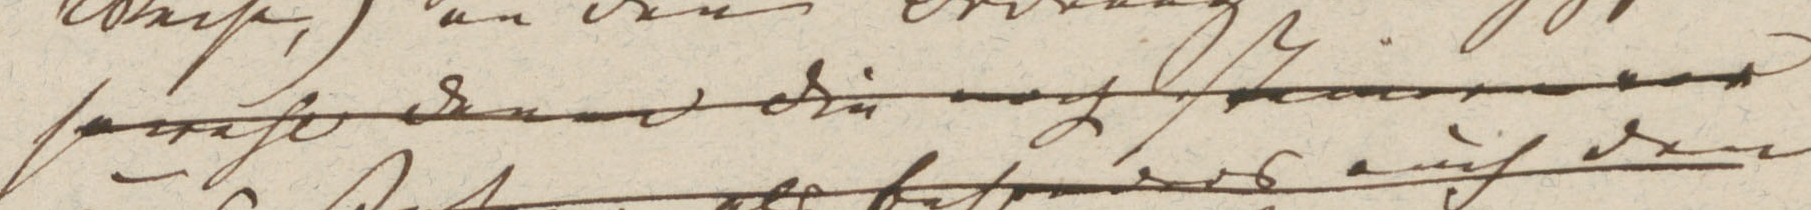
sowohl denen die noch steinerner
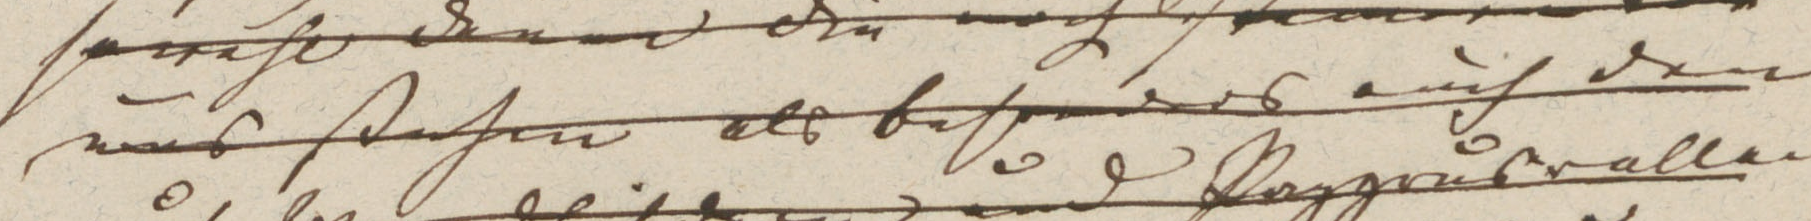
uns stehen als besonders auch den
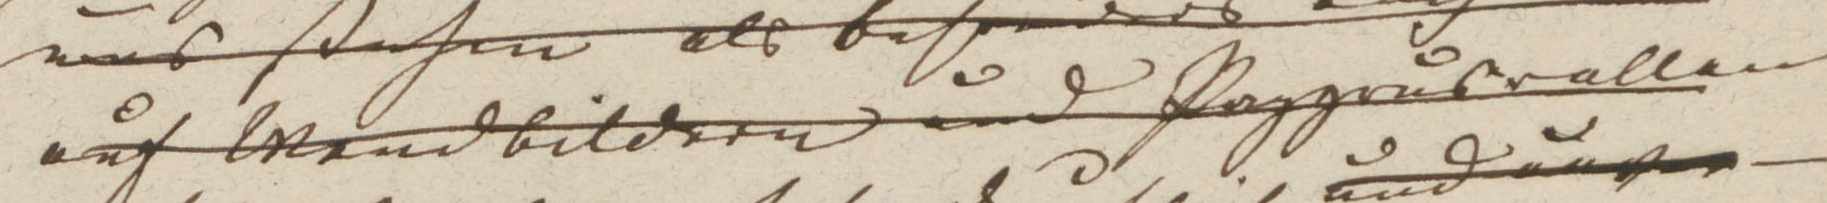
auf Wandbildern und Papyrusrollen
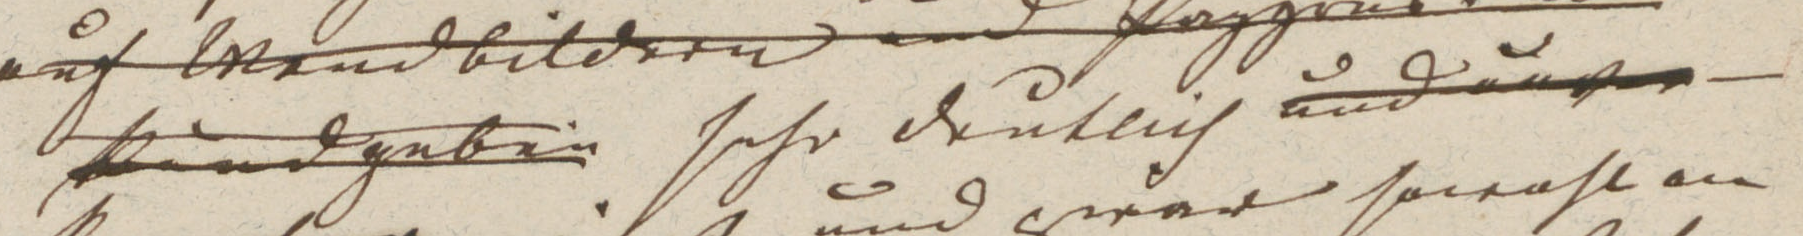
kundgeben sehr deutlich und unver-
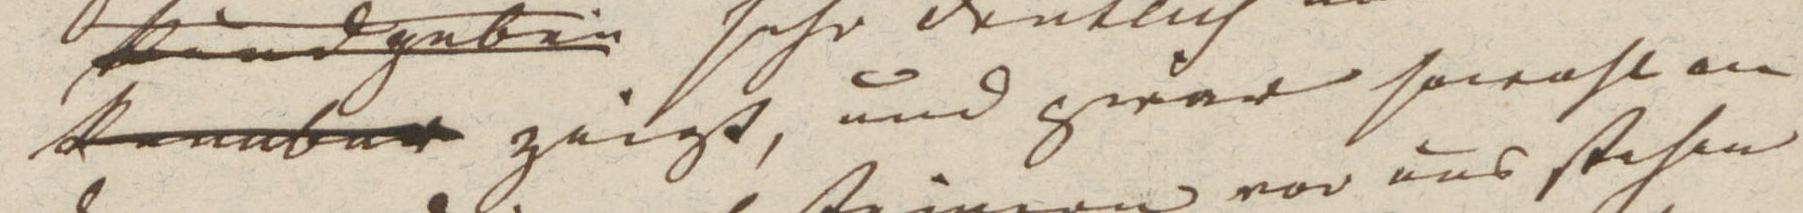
kennbar zeigt, und zwar sowohl an
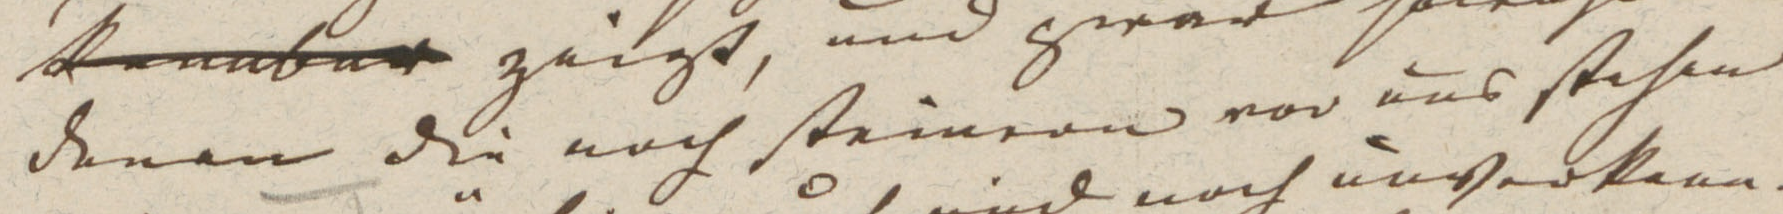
denen die noch steinern vor uns stehen
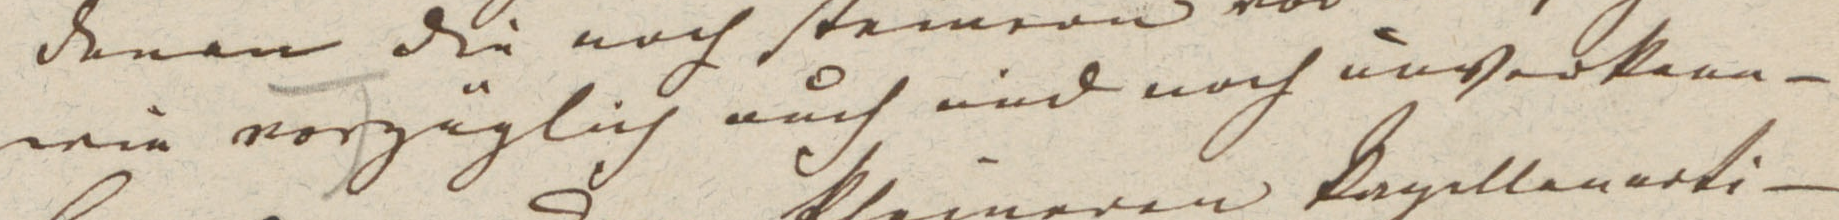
wie vorzüglich auch und noch unverkenn-
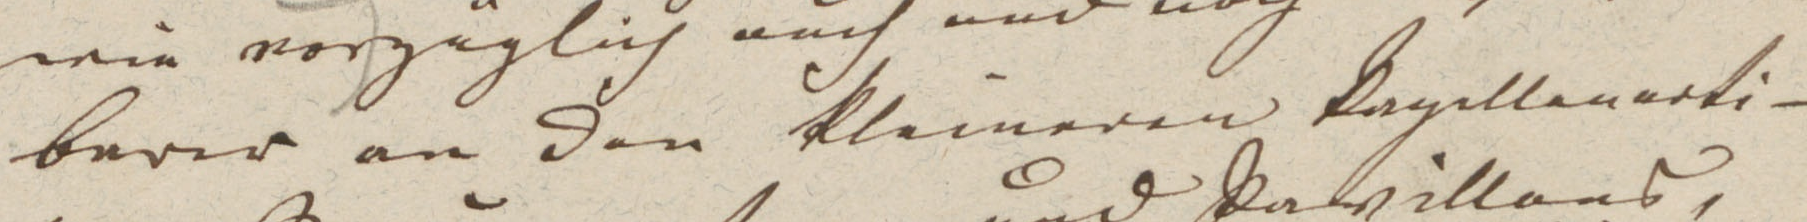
barer an den kleineren kapellenarti-
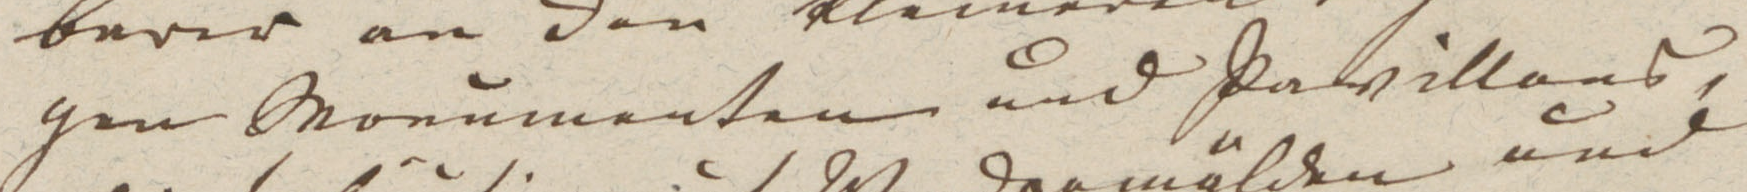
gen Monumenten und Pavillons,
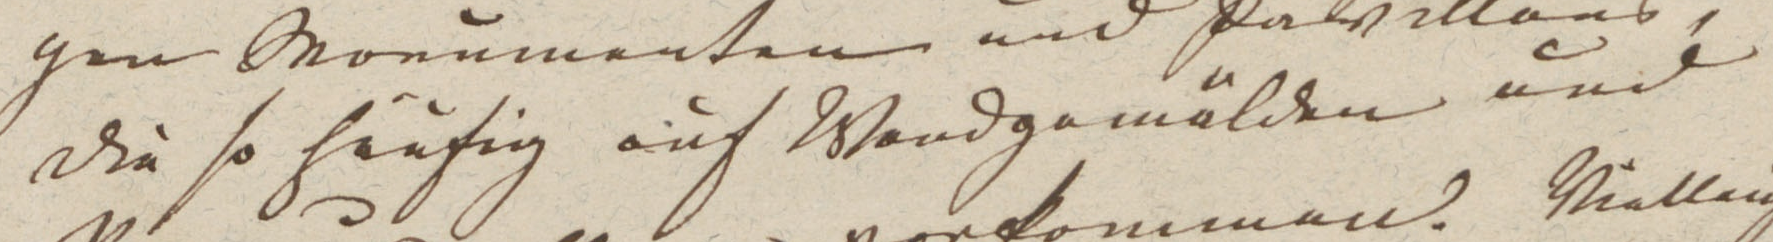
die so häufig auf Wandgemälden und
